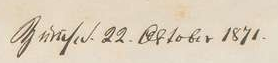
Zürich, d. 22. Oktober 1871.
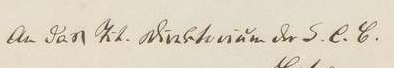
An das Tit. Direktorium der S.C.B.
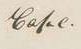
Basel.
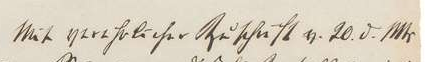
Mit verehrlicher Zuschrift v. 20. d. Mts
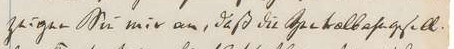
zeigen Sie mir an, daß die Zentralbahngesell.
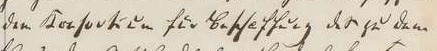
dem Konsortium für Beschaffung des zu dem
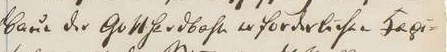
Baue der Gotthardbahn erforderlichen Kapi-
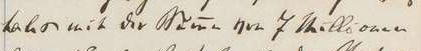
tales mit der Summe von 7 Millionen
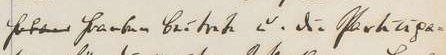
Frnken Franken beitrete u. die Participa-
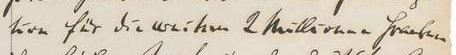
tion für die weitern 2 Millionen Franken
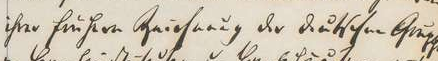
ihrer frührn Zeichnung der deutschen Gruppe
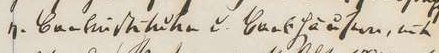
v. Bankinstituten u. Bankhäusern, mit
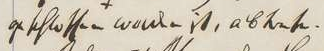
geschlossen worden ist, abtrete.
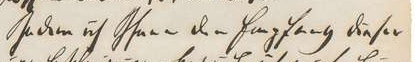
Indem ich Ihnen den Empfang dieser
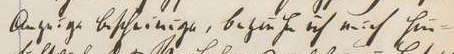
Anzeige bescheinige, beziehe ich mich hin-
